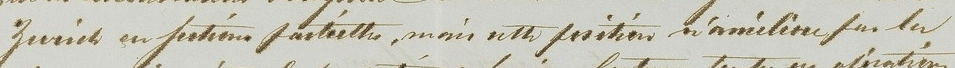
Zurich en sections partielles, mais cette position n'améliore pas la
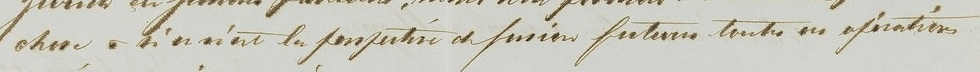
chose & si ce n'est la perspective de fusions futures toutes ces opérations
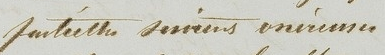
partielles seraient onéreuses.
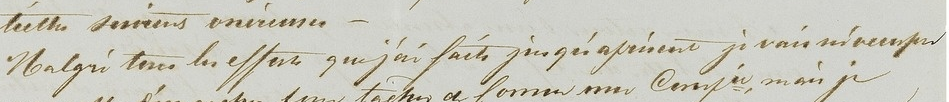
Malgré tous les efforts que j'ai faits jusqu'aprésent je vais m'occuper
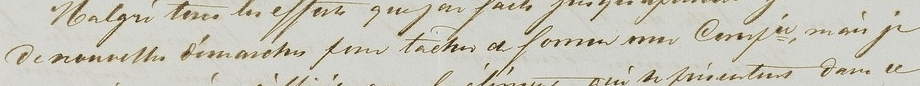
de nouvelles démarches pour tacher de former ma Compie, mais je
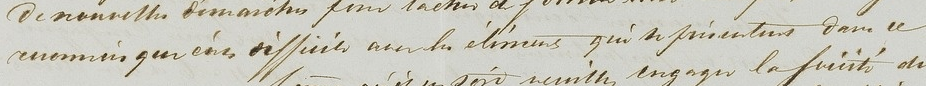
reconnais que c'est difficile avec les éléments qui se présentent dans ce
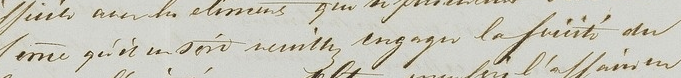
Comme qu'il en soit veuillez engager la Société du
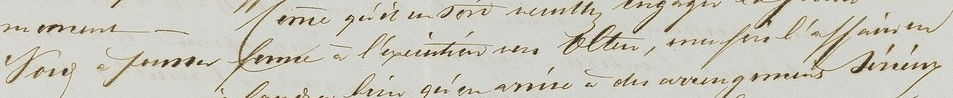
Nord a pousser forme à l'exécution vers Olten, une fois l'affaire en
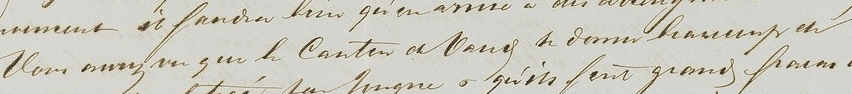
Vous avez vu que le Canton de Vaud se donne beaucoup de
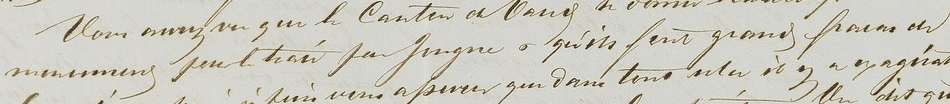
mouvement pour le train par Jougne & qu'ils font grand fracas de
